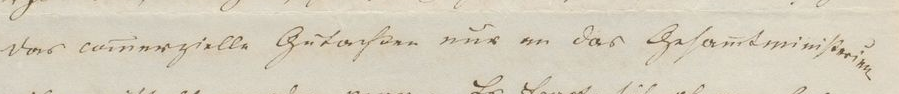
das commerzielle Gutachten nur an das Gesammtministerium
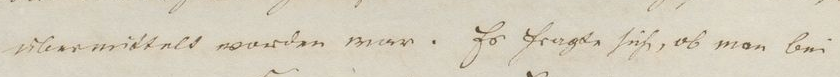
übermittelt worden war. Es fragte sich, ob man bei
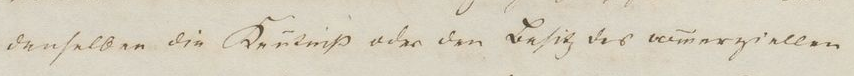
denselben die Kenntniß oder den Besitz des commerziellen
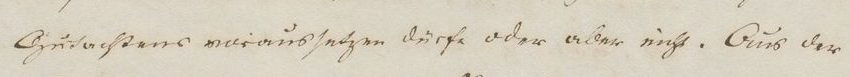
Gutachtens voraussetzen dürfe oder aber nicht. Aus der
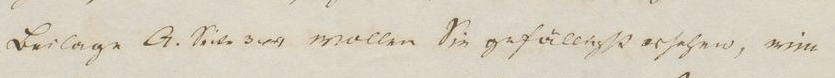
Beilage A. Seite 3 & 4 wollen Sie gefälligst ersehen, wie
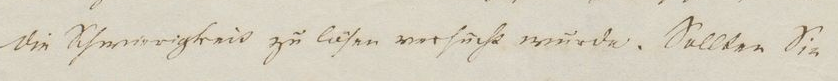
die Schwierigkeit zu lösen versucht wurde. Sollten Sie
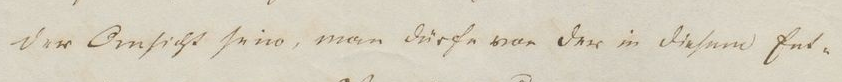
der Ansicht sein, man dürfe von der in diesem Ent-
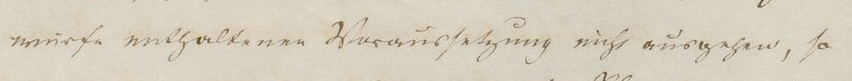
wurfe enthaltenen Voraussetzung nicht ausgehen, so
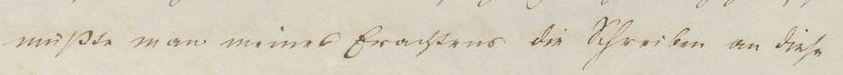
müßte man meines Erachtens die Schreiben an diese
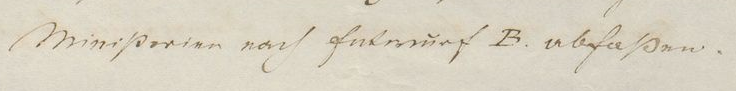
Ministerien nach Entwurf B. abfaßen.
